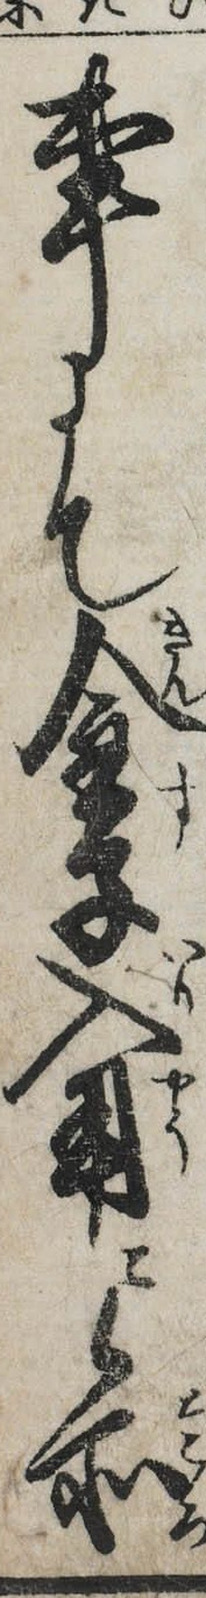事にて金子入用に候所

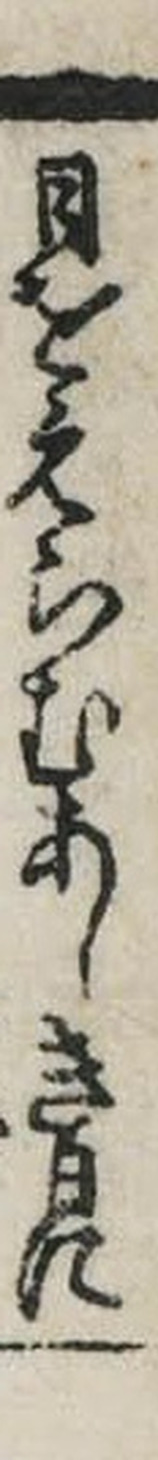日をえらむあしき日に
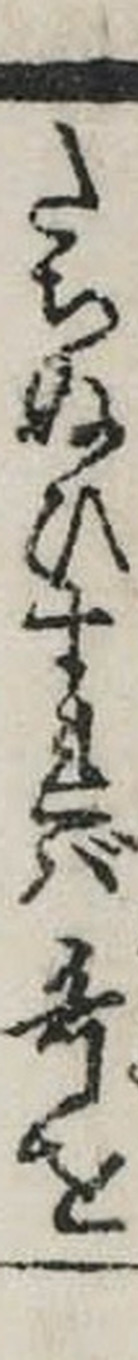たちぬひすれば歌を
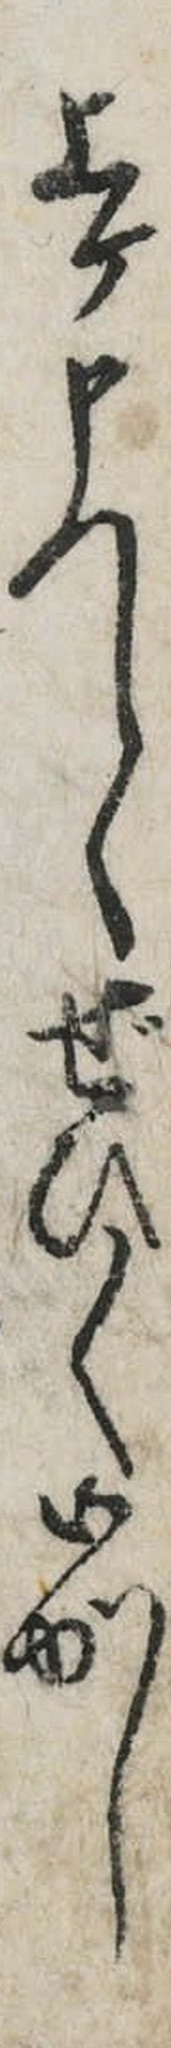上ケ申へく候ぜひ〳〵御かし
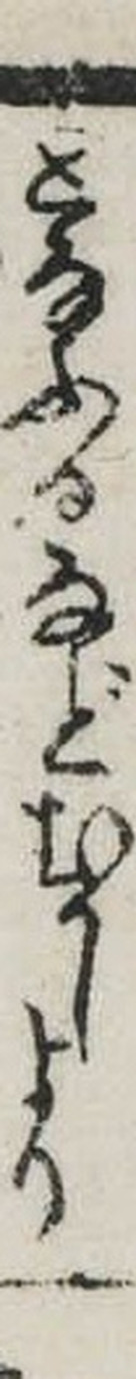となふるなどむかしより
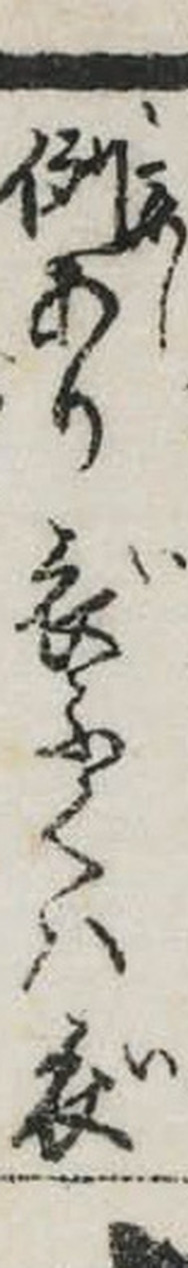例あり衣ふくは衣
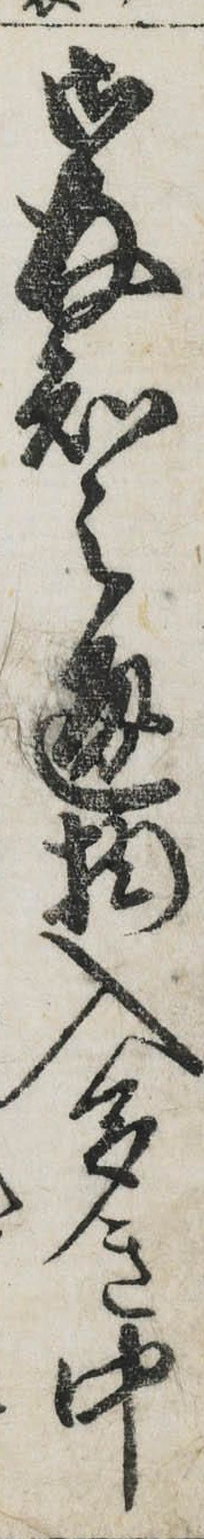御存知之通物入多き中
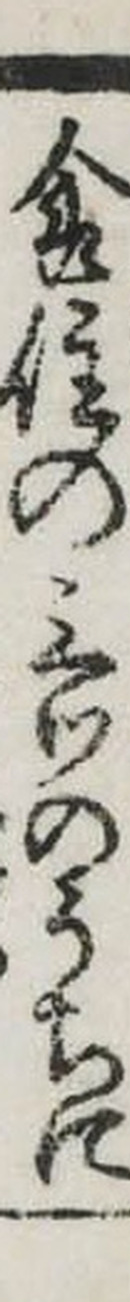食住の三ツのうちに
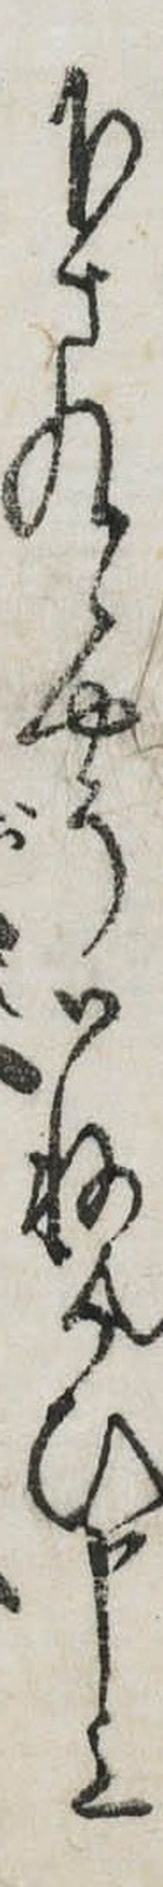下され候やう御ねかひ申上
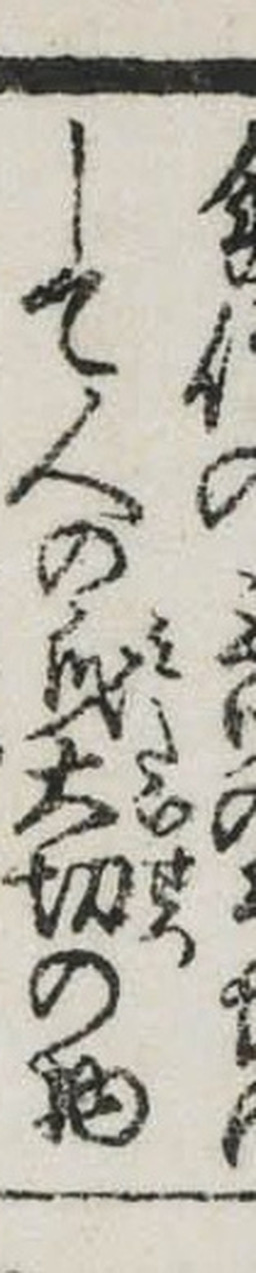して人の身大切の物
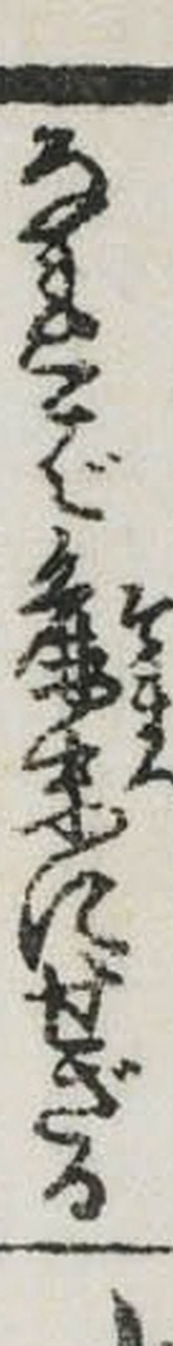なれば麁末にせざる
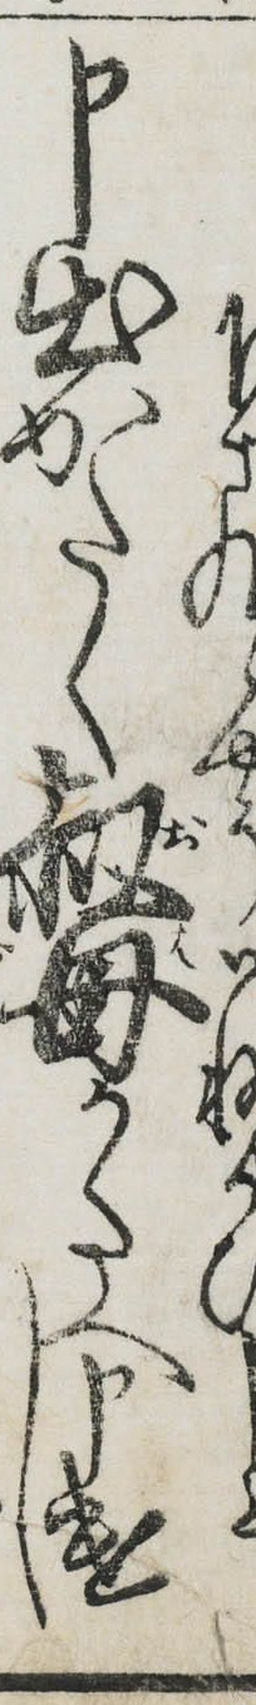申出かたく叔母かたへ申遣し
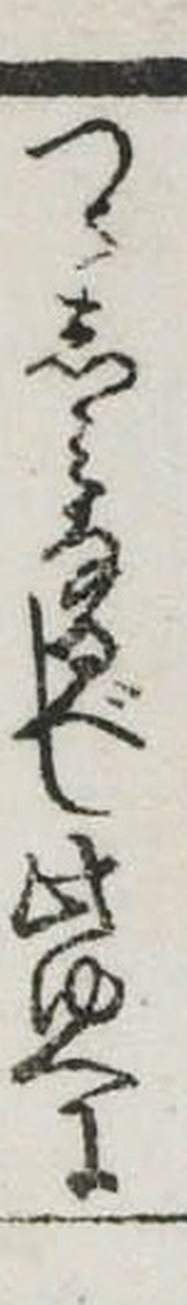つゝしみなるべし此ゆへに
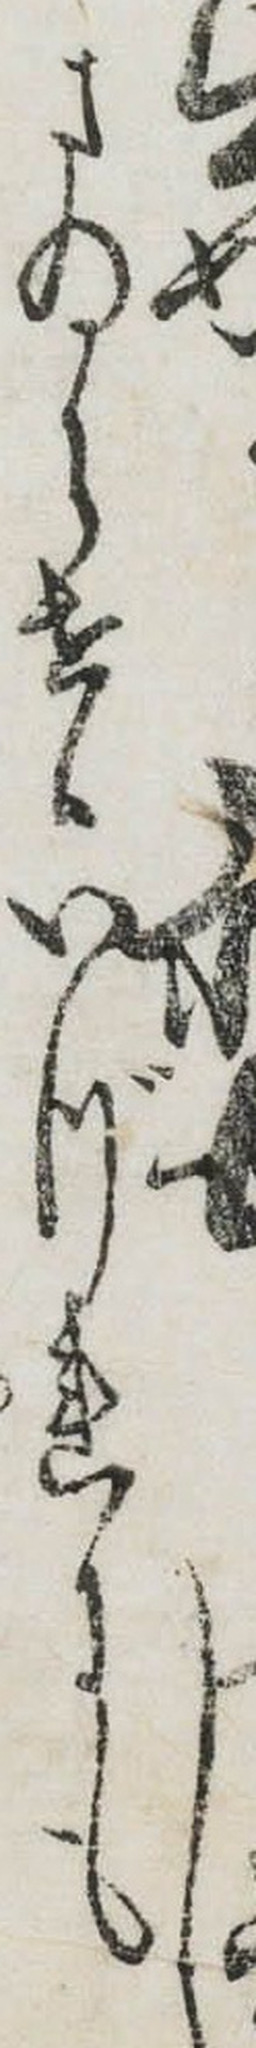まゐらせ候いづれにも
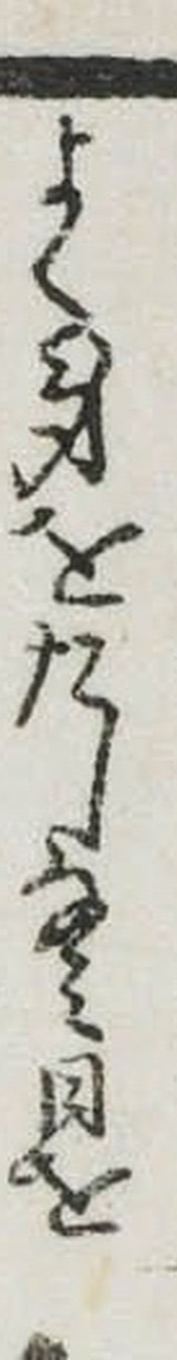よく身をたしなみ日を
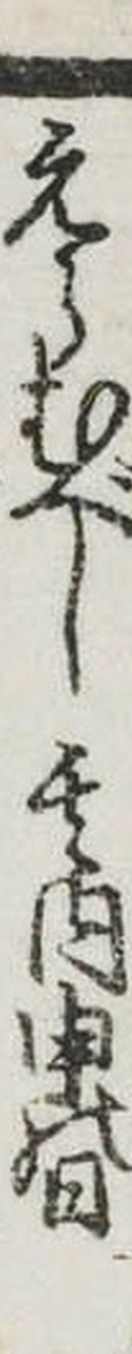えらむべし其内申の日
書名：頭書萬用婦人手紙之文言
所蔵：東京学芸大学教育コンテンツアーカイブ
